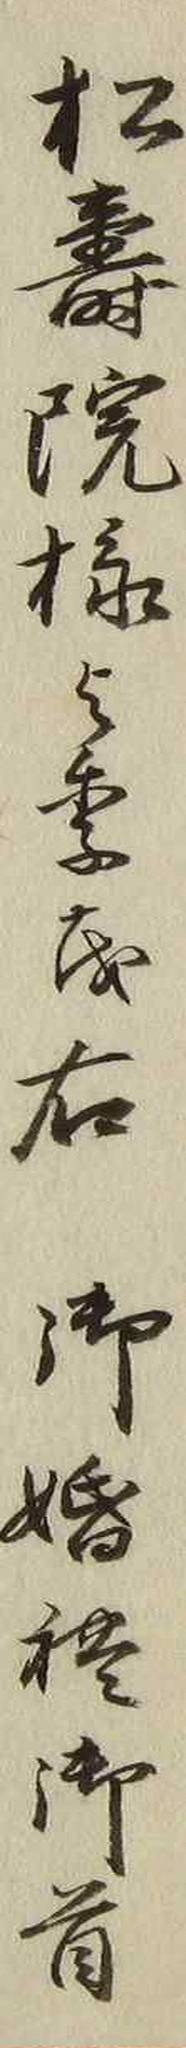松寿院様よりも右御婚礼御首
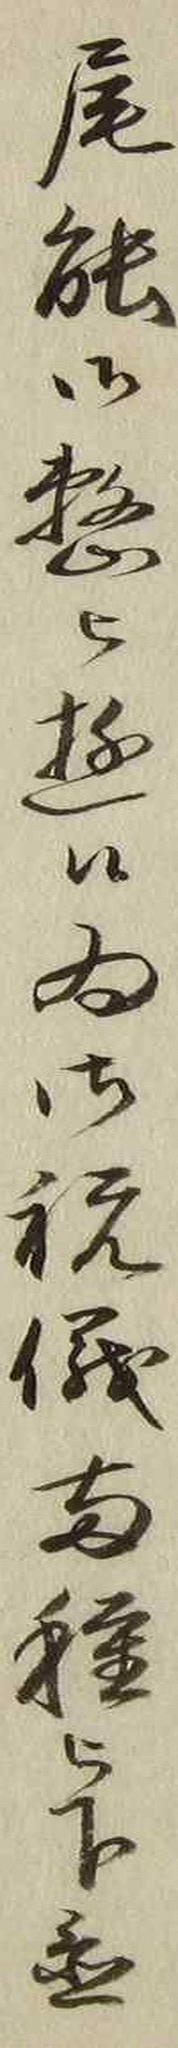尾能御整被遊候為御祝儀両種被下置
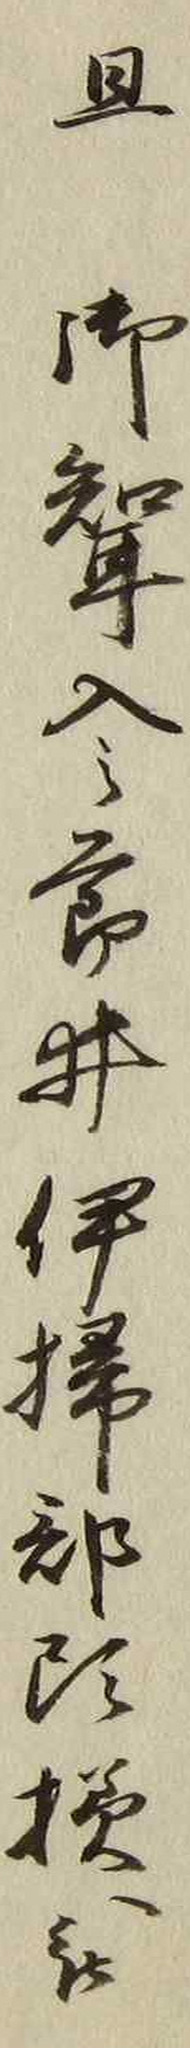且御聟入之節井伊掃部頭様へ被
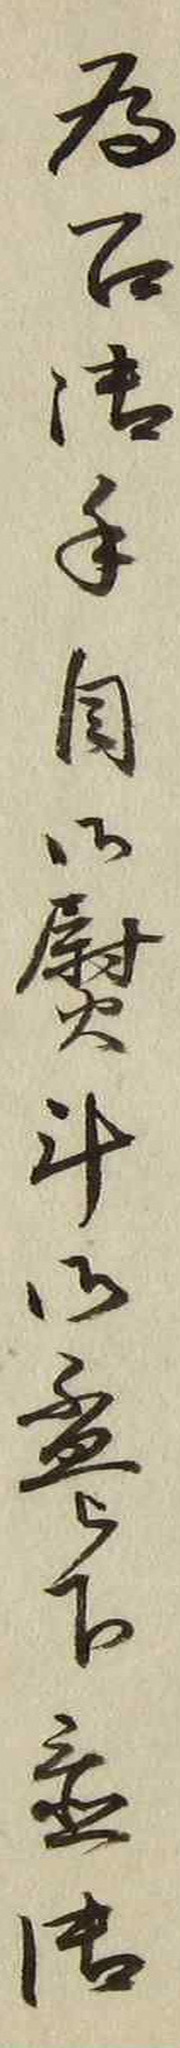為召御手自御熨斗御盃被下置御
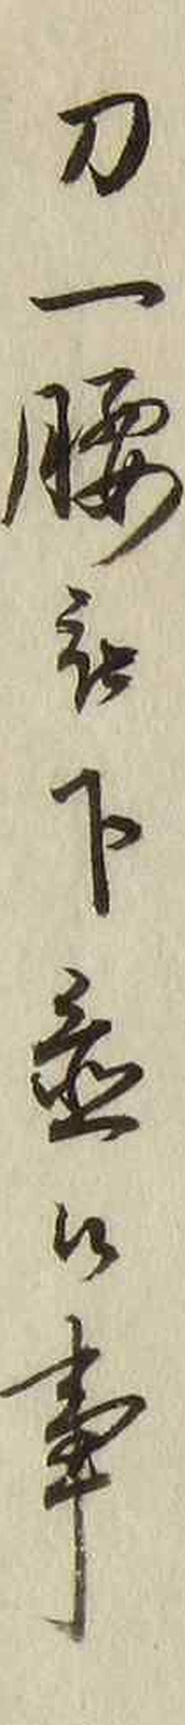刀一腰被下置候事
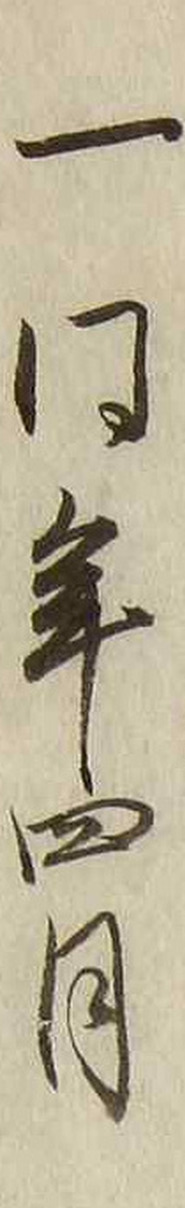一同年四月
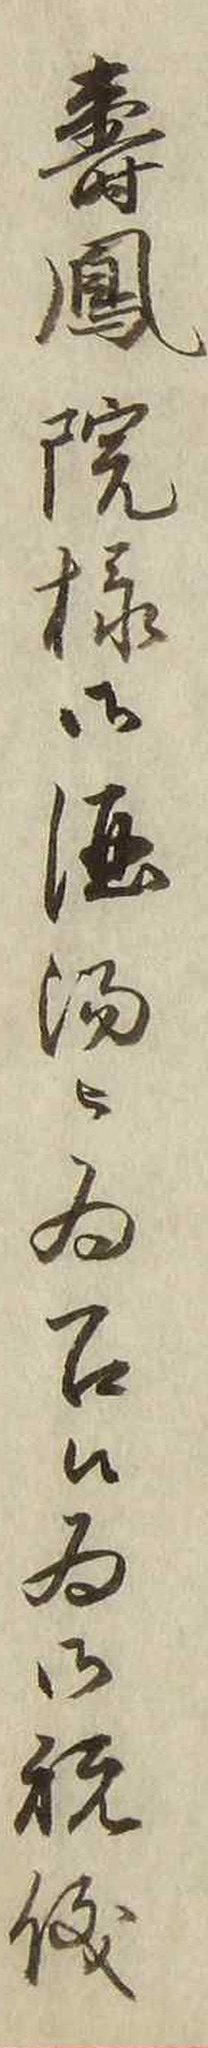寿鳳居様御徳湯被為召候為御祝儀

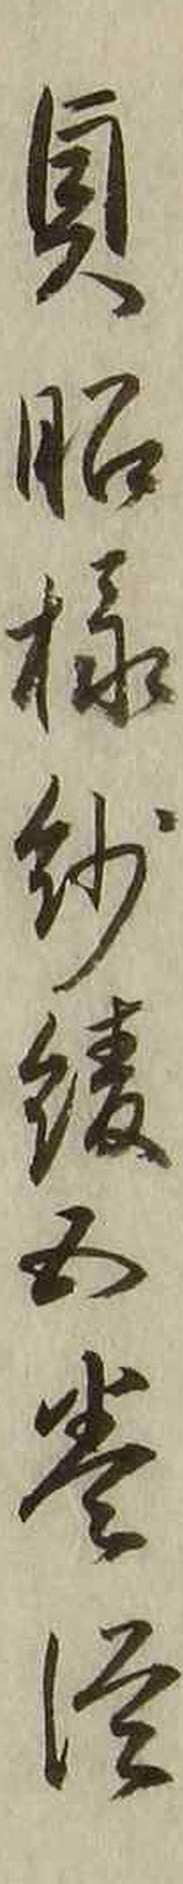貞昭様沙綾五巻従
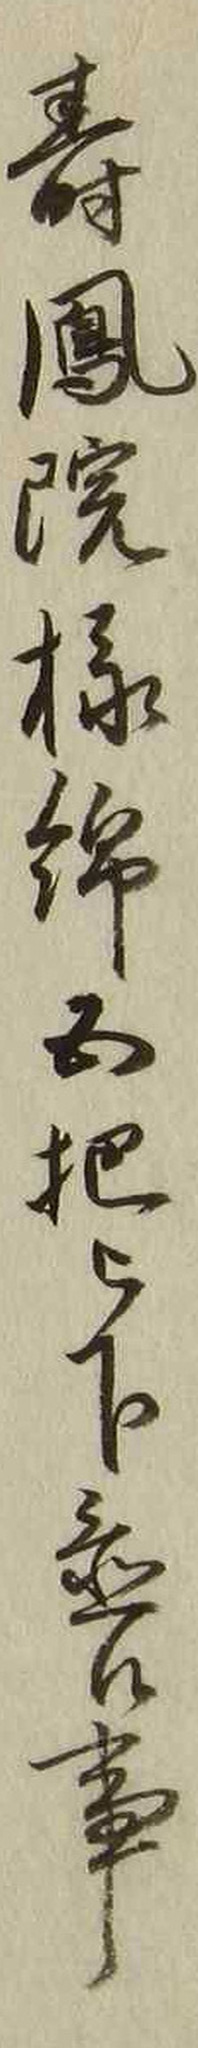寿鳳院様綿五把被下置候事
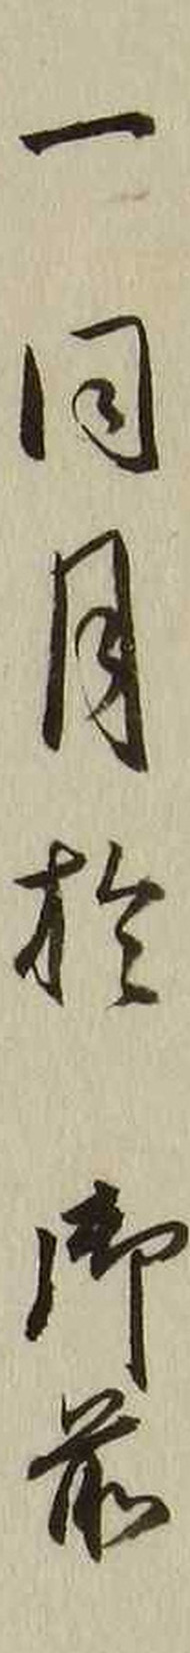一同月於御前
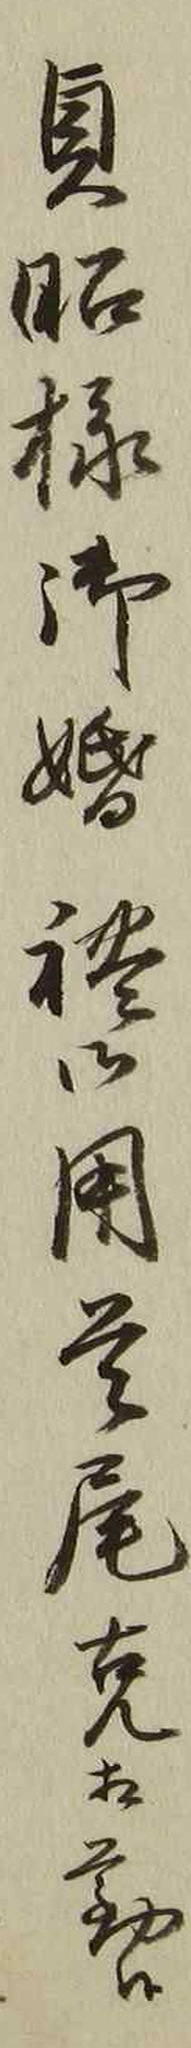貞昭様御婚礼御用首尾克相勤候
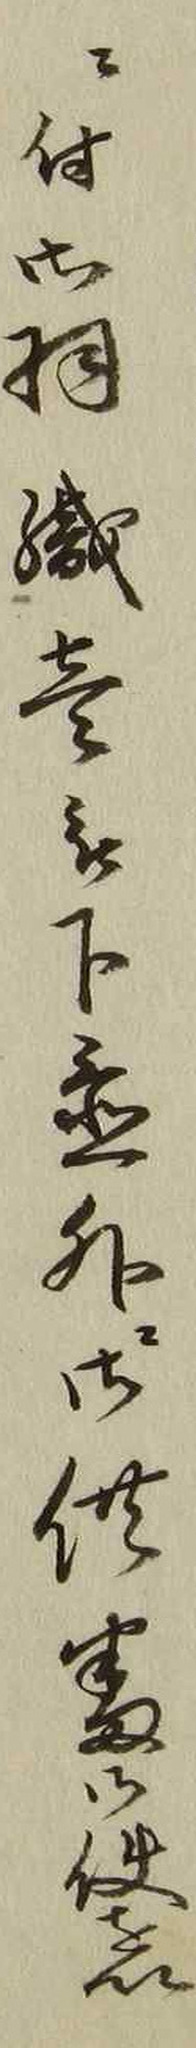に付御羽織壱被下置外に御供番御使を以
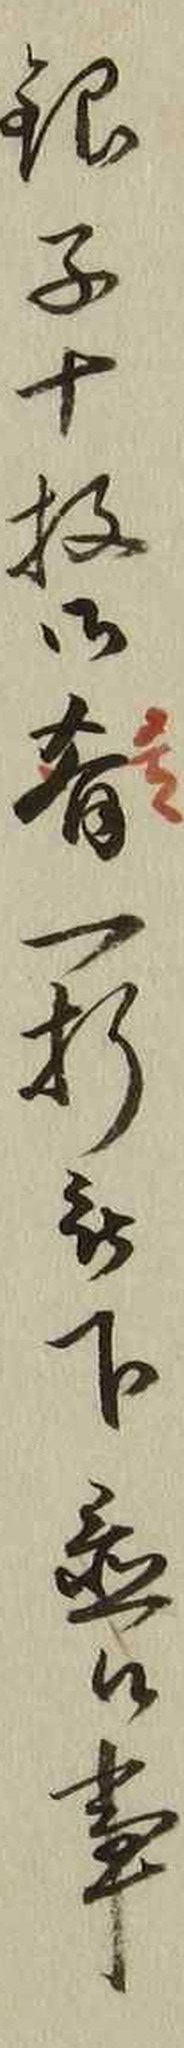銀子十枚御肴一折被下置候事
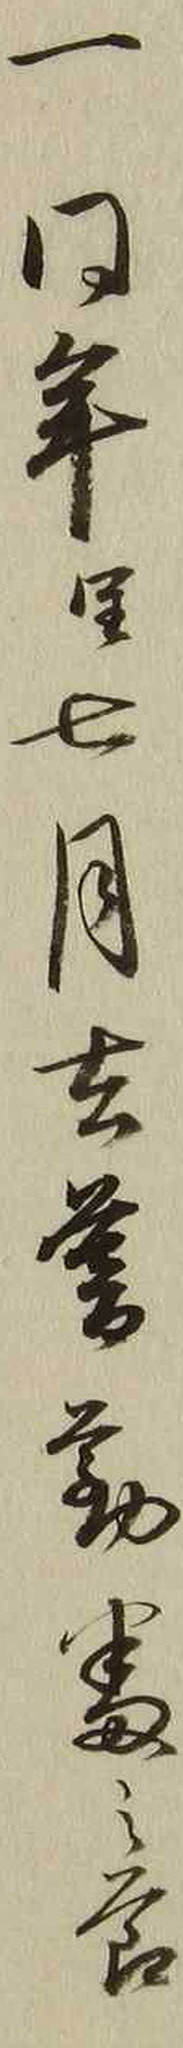一同年閏七月去暮勤番之節
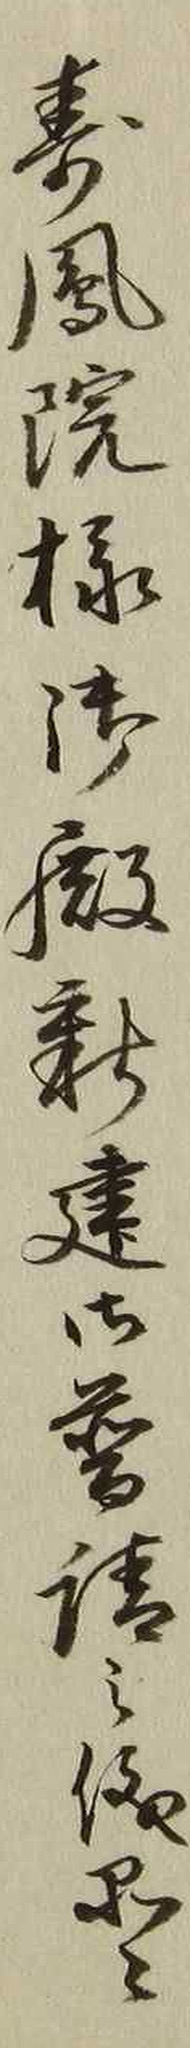寿鳳院様御殿新建御普請之儀品々
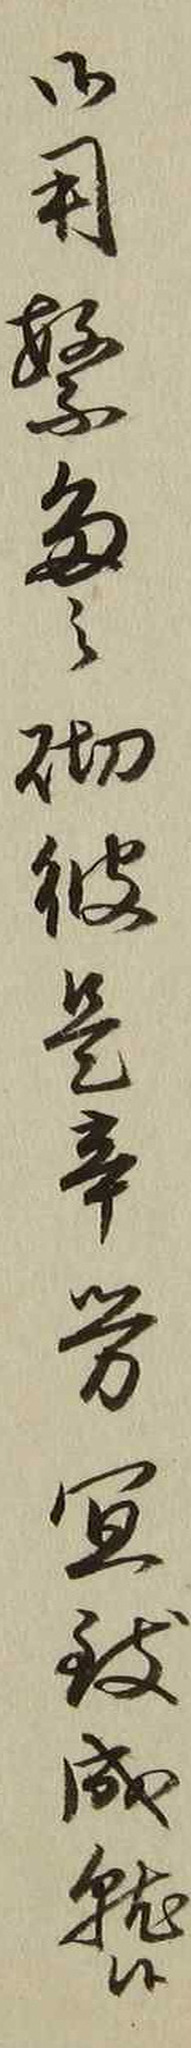御用繁多之砌彼是辛労宜致成就候
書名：諸士系譜　巻之125　た之部1
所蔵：会津若松市立会津図書館
